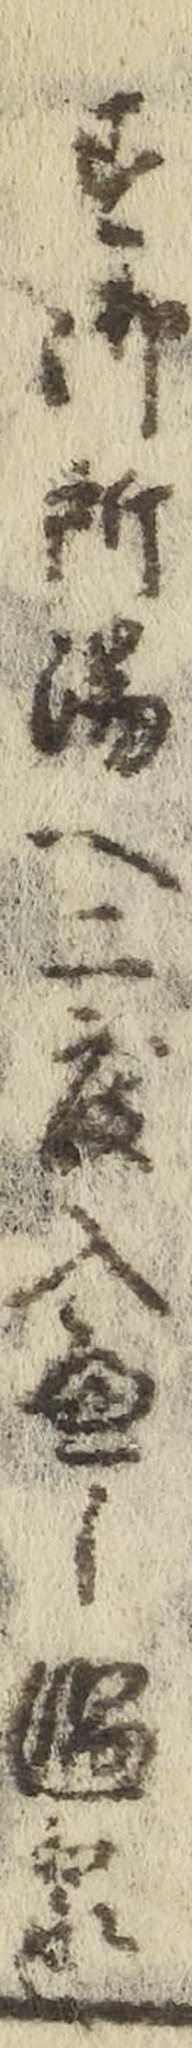す御所湯へ二度入へし温泉
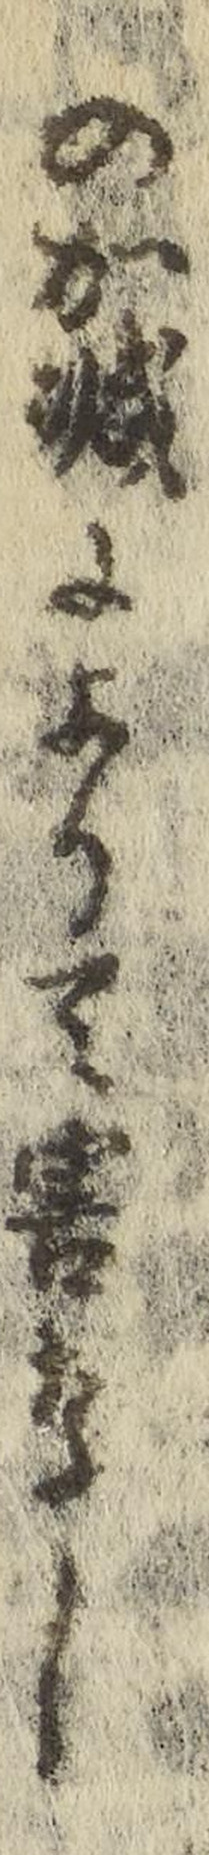の加減によりて害なし

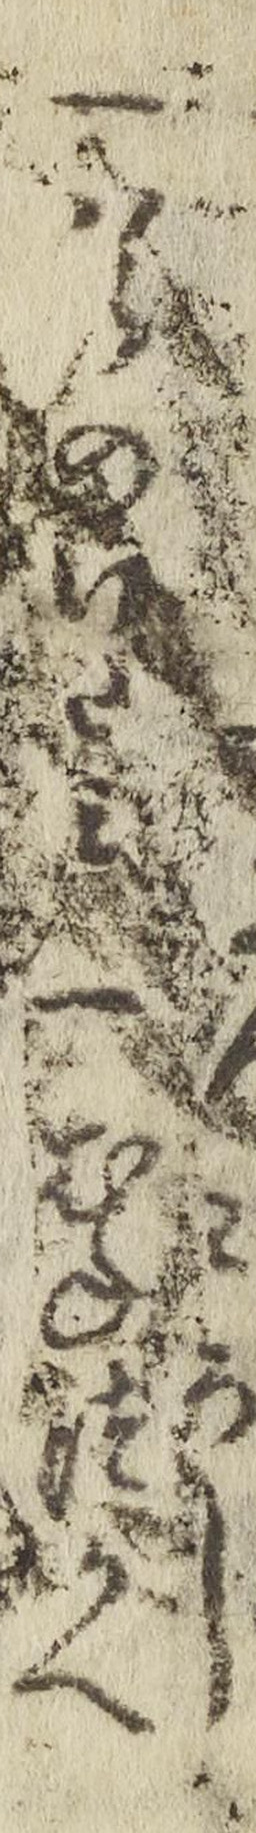一はらのいたみ一むねつかへ
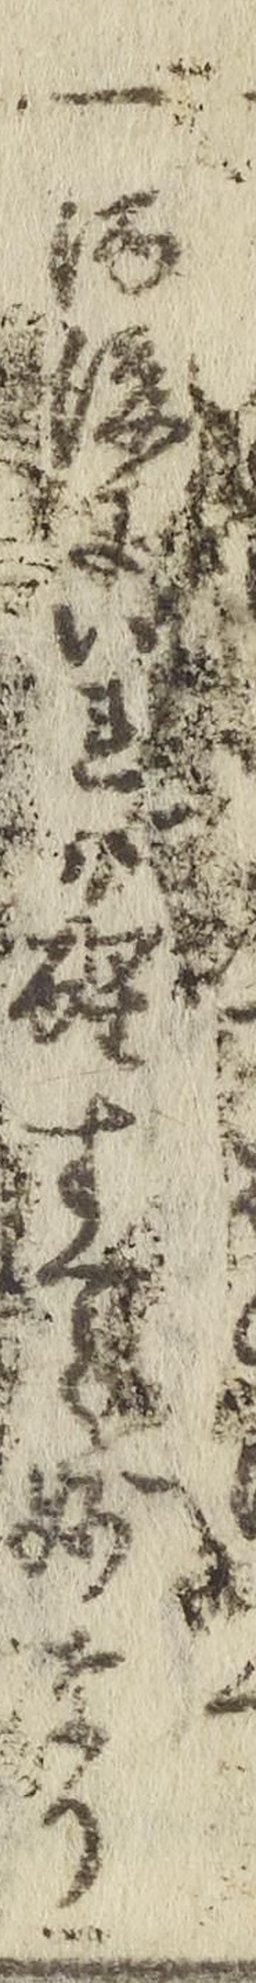一酒後にいれは醒すこと妙なり
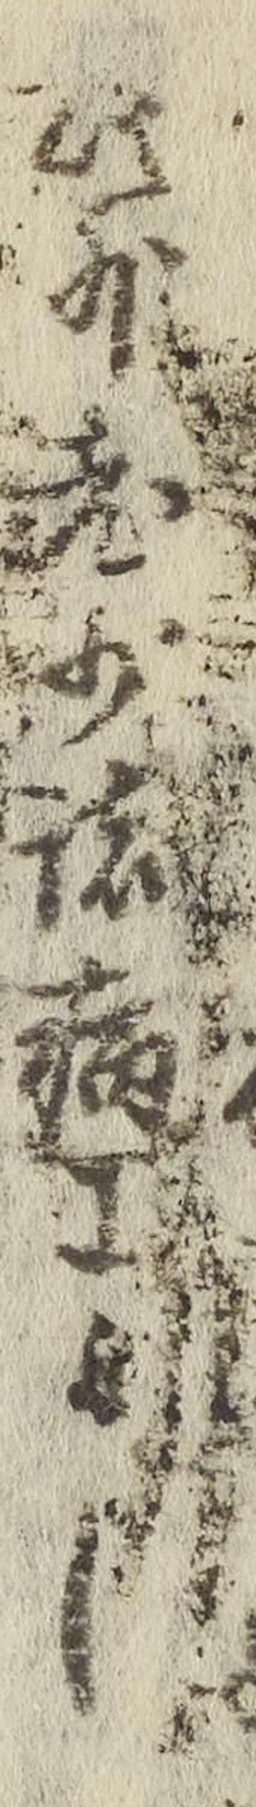此外老少諸病によし
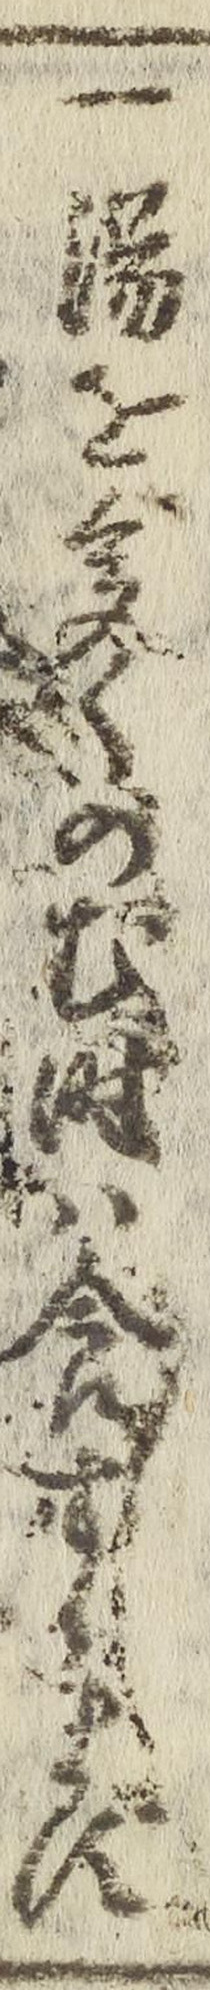一湯を多くのむ時は含すゝきず
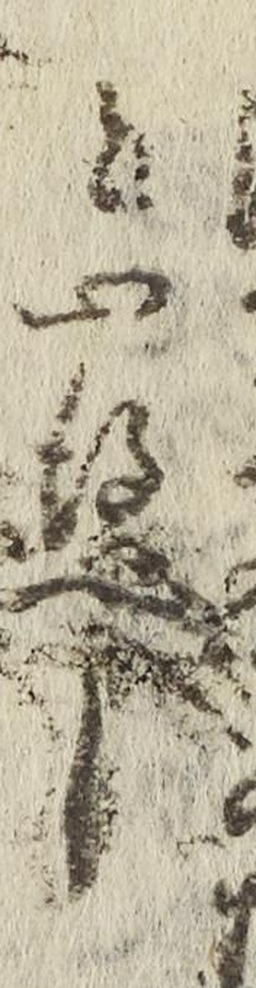と心得べし
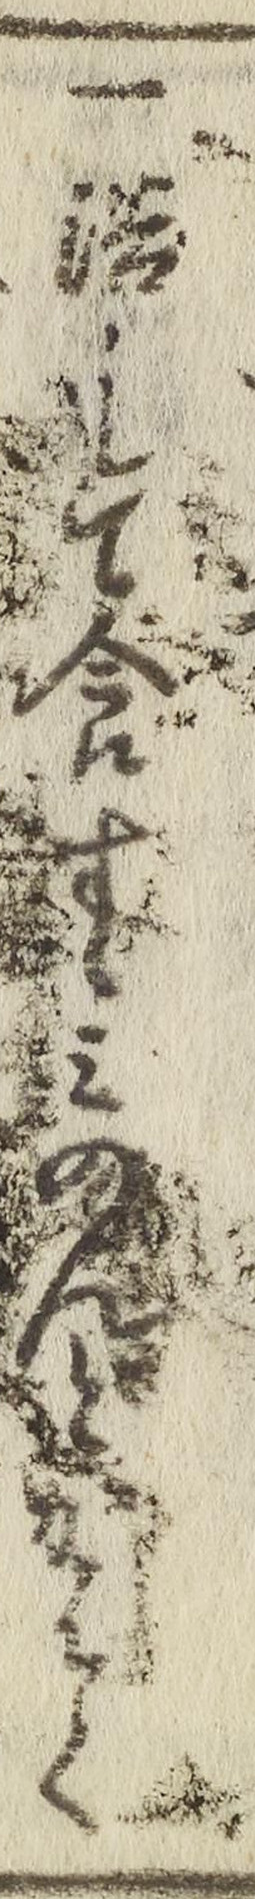一浴して含すゝみのんどかはく
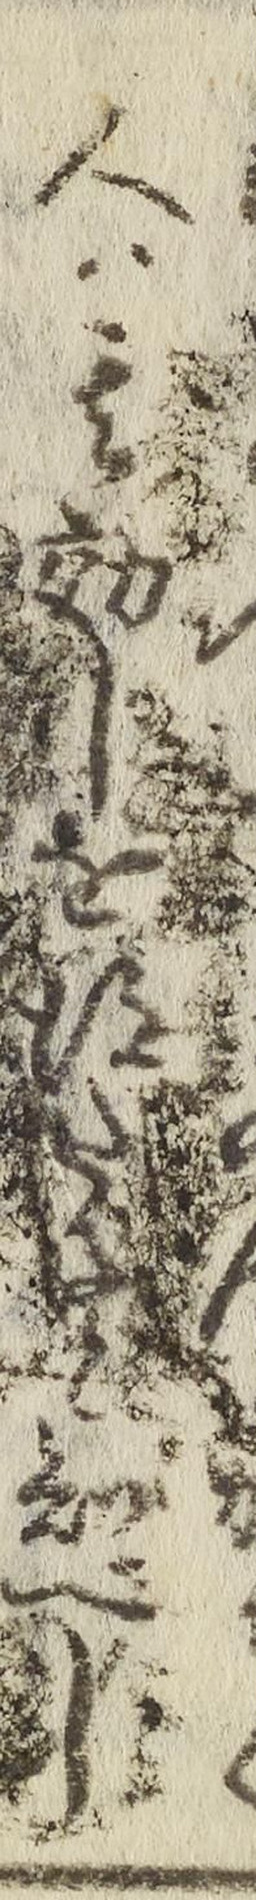人は其効しを得たると知べし
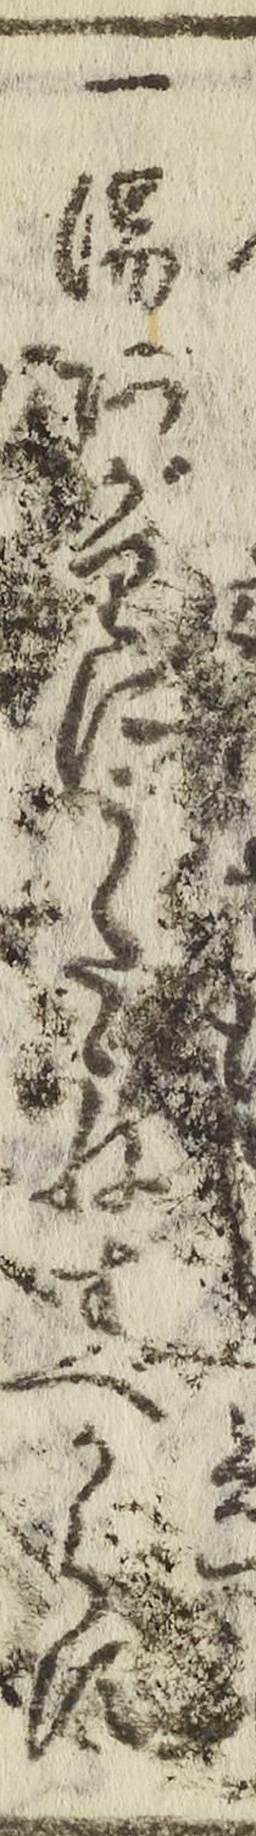一湯あがりにうたゝねすべからす
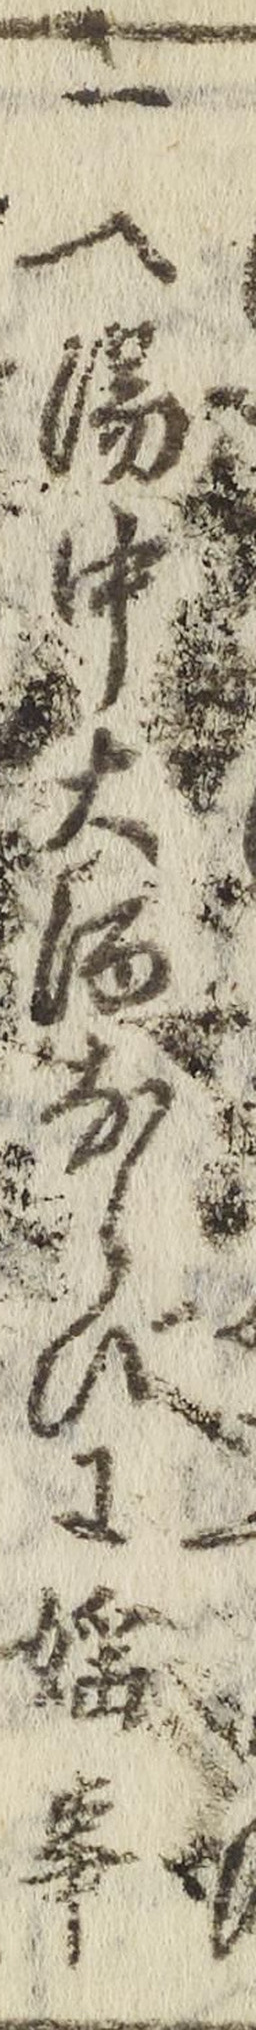一入湯中大酒ならびに婬事
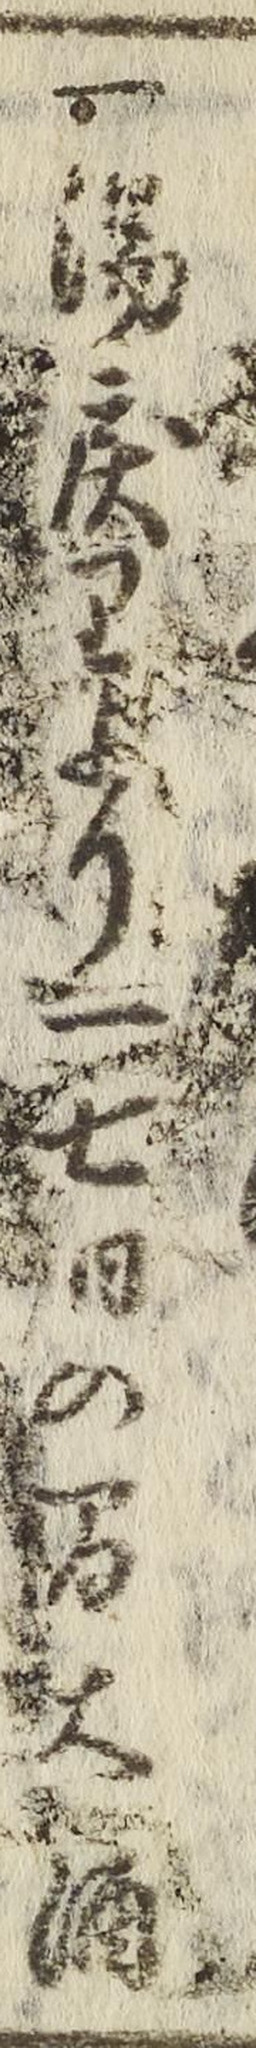一湯戻りより一七日の間大酒
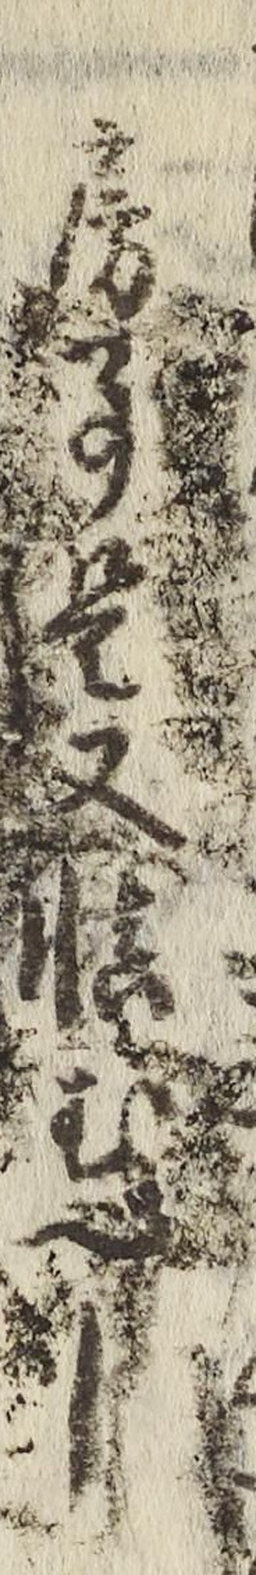房事是又慎べし
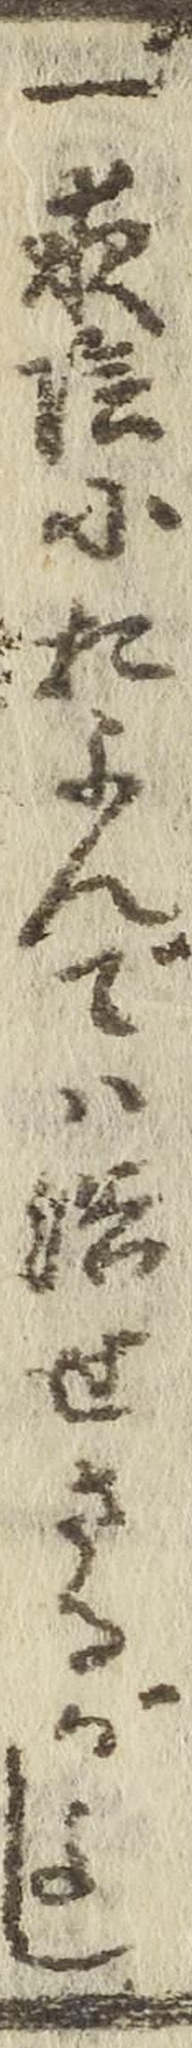一夜陰におよんでは浴せさるがよし
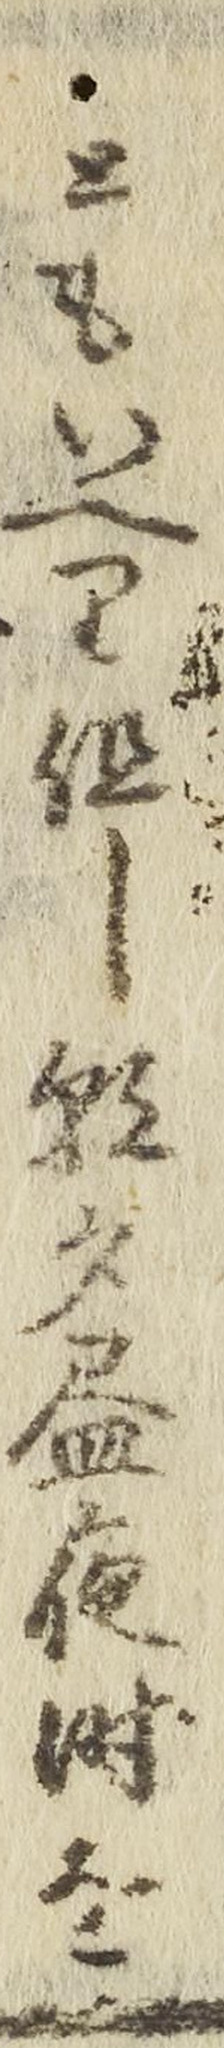ともいへり但し朝夕昼夜時を
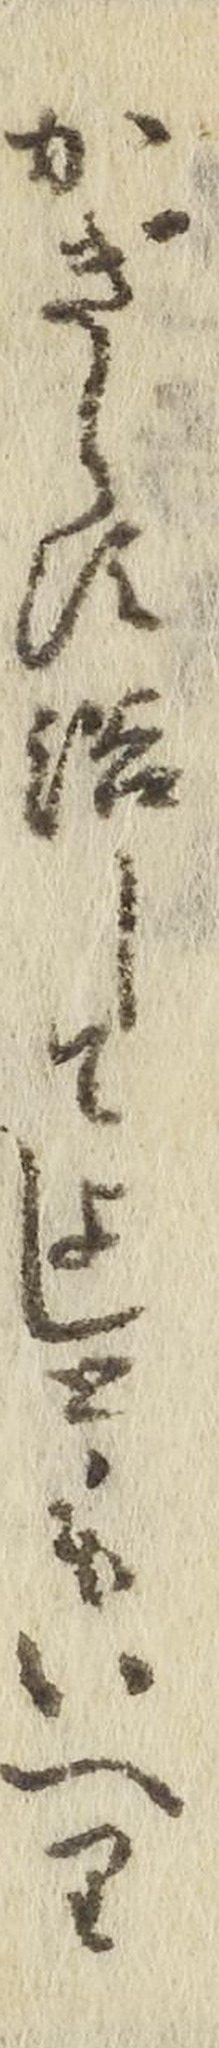かぎらす浴してよしともいへり
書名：日光山中禅寺　温泉記　全
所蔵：東京大学地震研究所図書室 Earthquake Research Institute Library, The University of Tokyo, JAPAN
